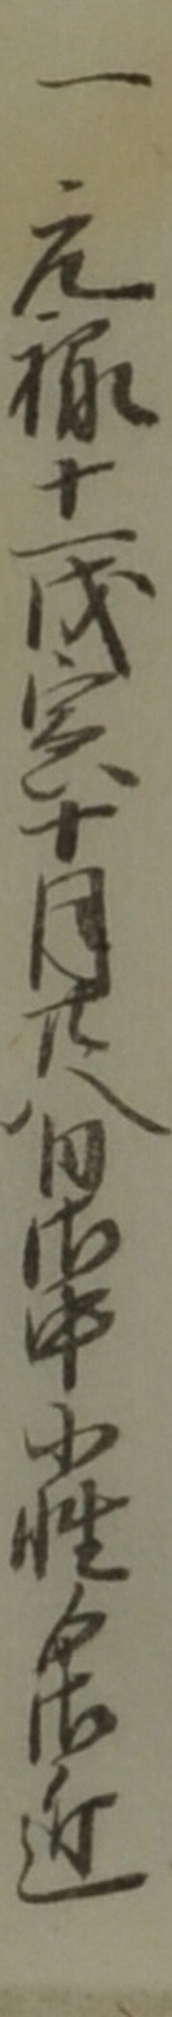一元禄十一戊寅十月廿八日御中小性ゟ御近
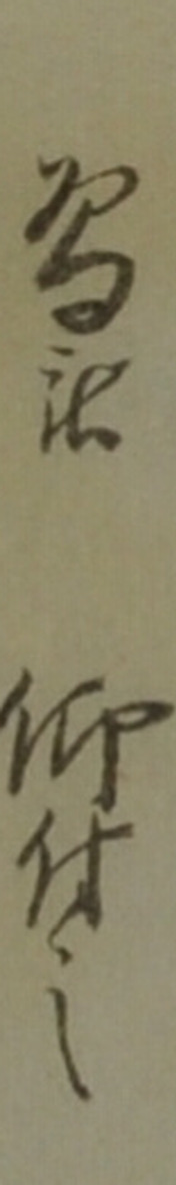習被仰付之
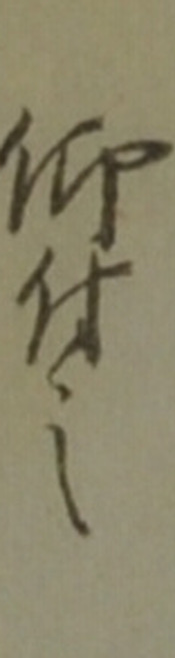仰付之
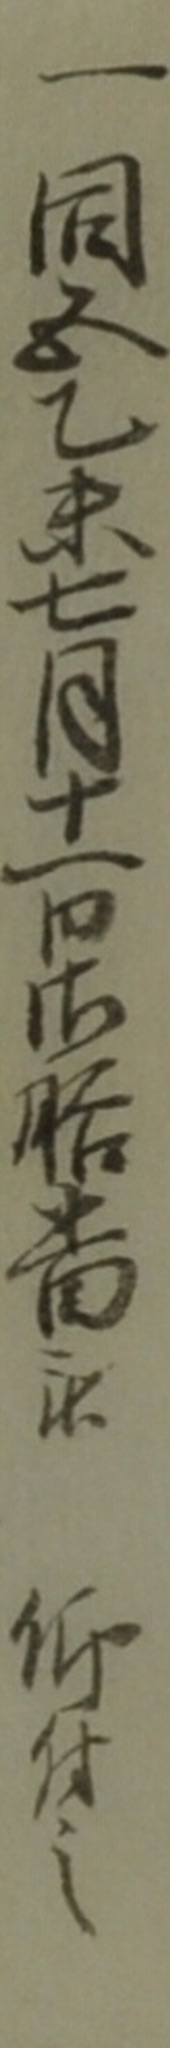一同五乙未七月十一日御膳番被仰付之
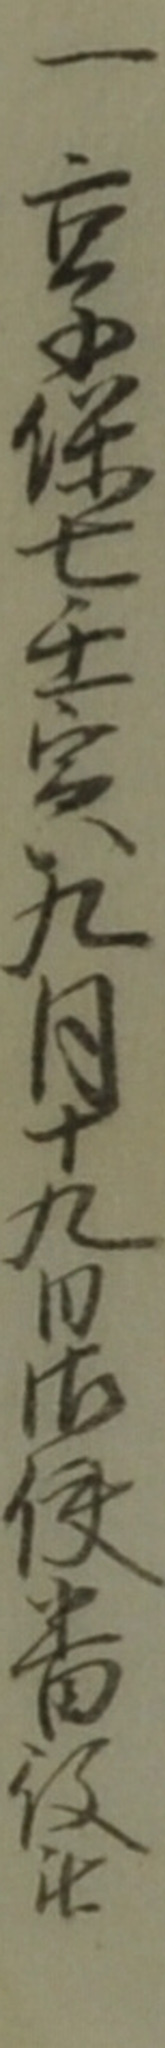一享保七壬寅九月十九日御使番役被
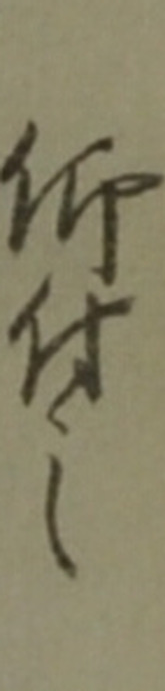仰付之
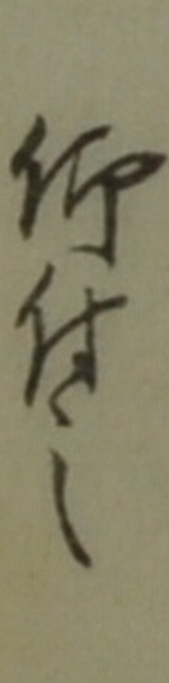仰付之
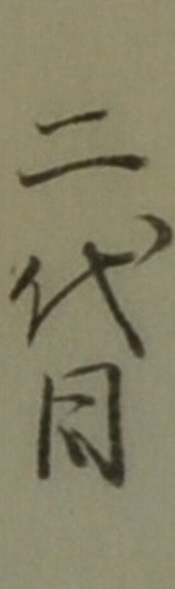二代目
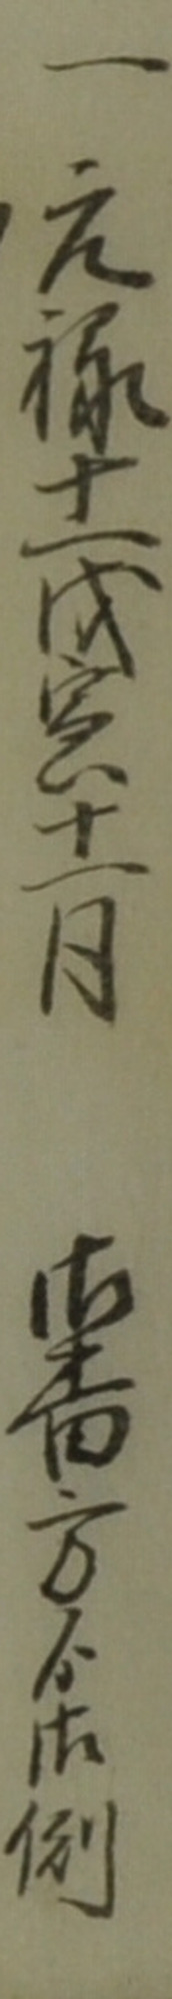一元禄十一戊寅十一月御番方ゟ御側
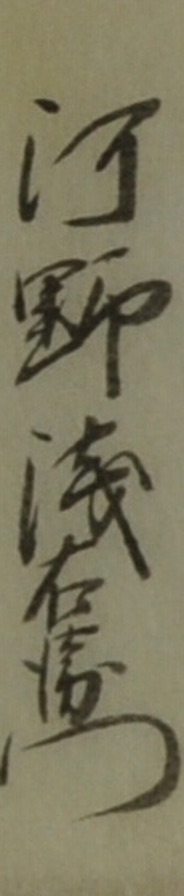河野浅右衛門
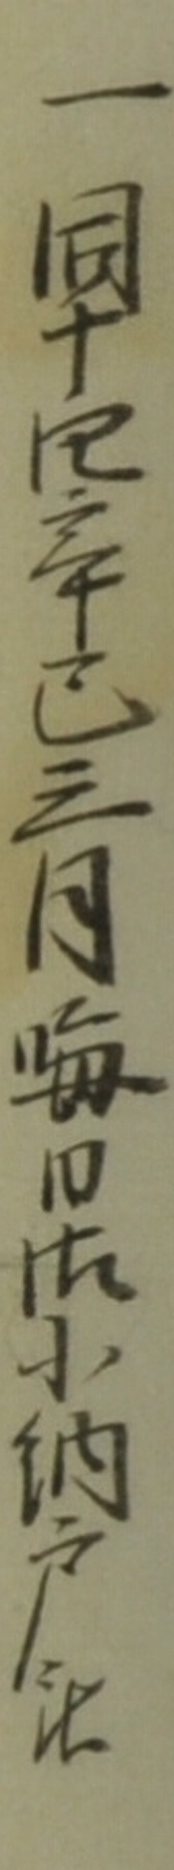一同十四辛巳三月晦日御小納戸被
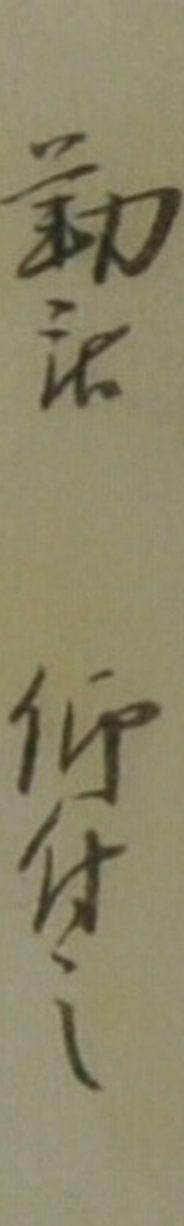勤被仰付之

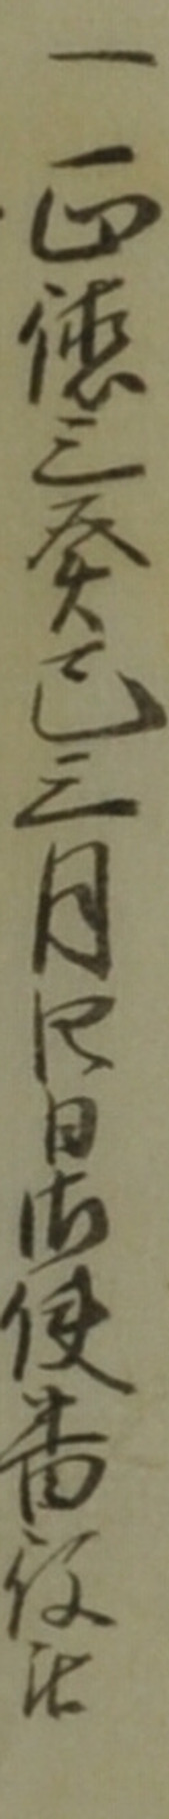一正徳三癸巳三月四日御使番役被
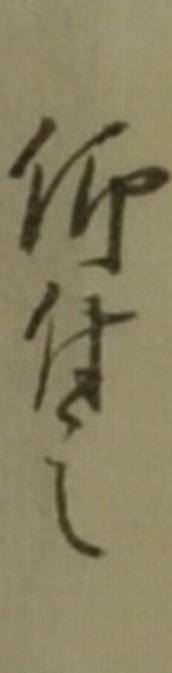仰付之
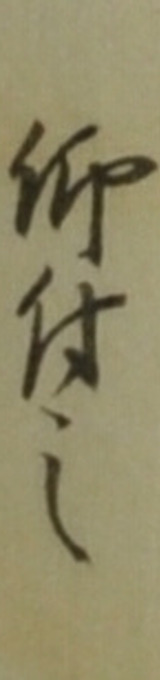仰付之
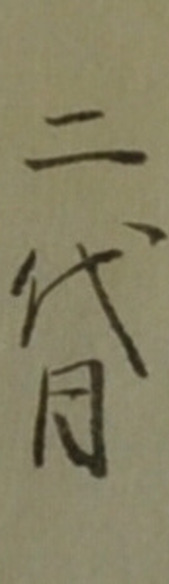二代目
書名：諸御役代々録（五）
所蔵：伊那市立高遠町図書館・合同会社AMANE
